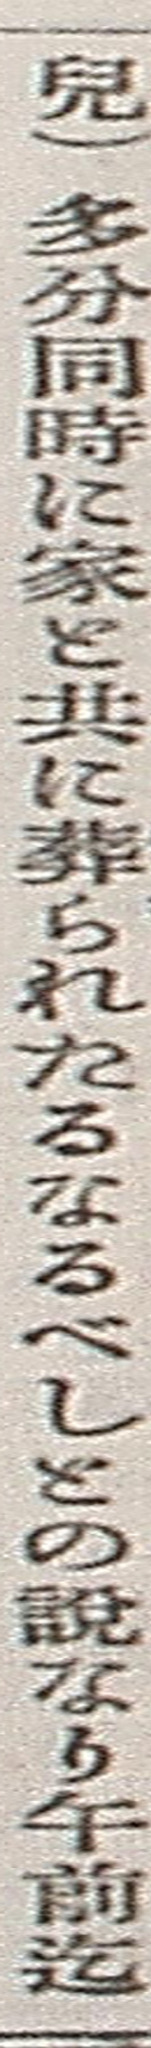兒）多分同時に家と共に葬られたるなるべしの説なり午前迄

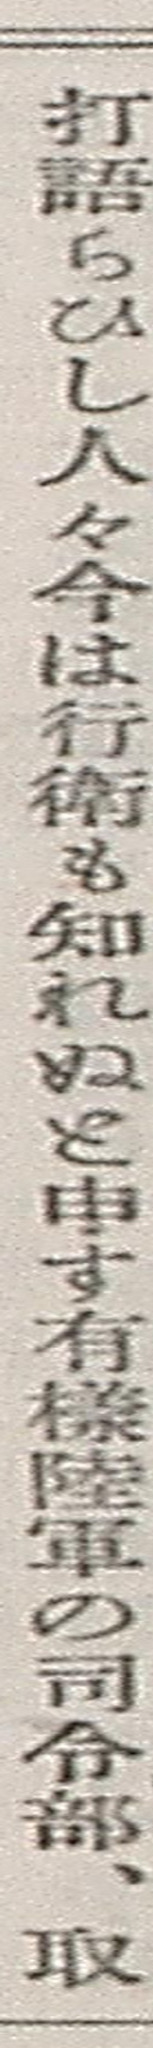打語らひし人々今は行衛も知れぬと申す有様陸軍の司令部、取
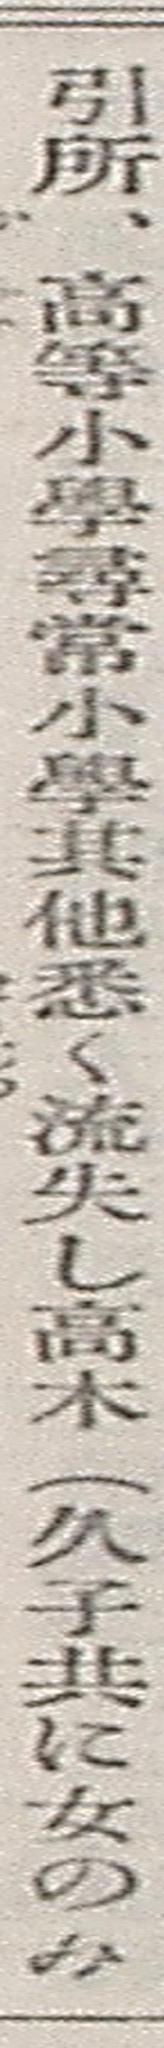引所、高等小学校尋常小学校其他悉く流失し高木（久子共に女のみ
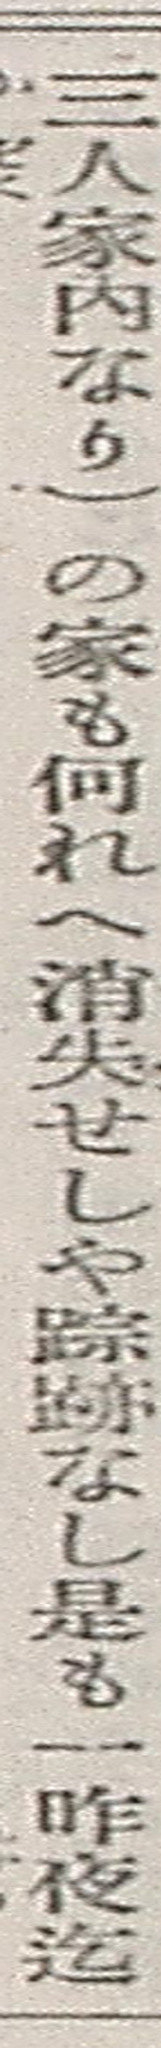三人家内なり）の家も何れへ消失せしや踪跡なし是も一昨夜迄
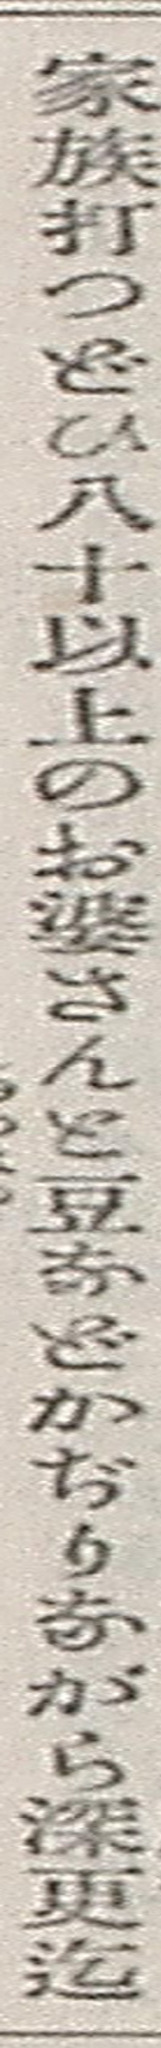家族打つどひ八十以上のお婆さんと豆などかぢりながら深更迄
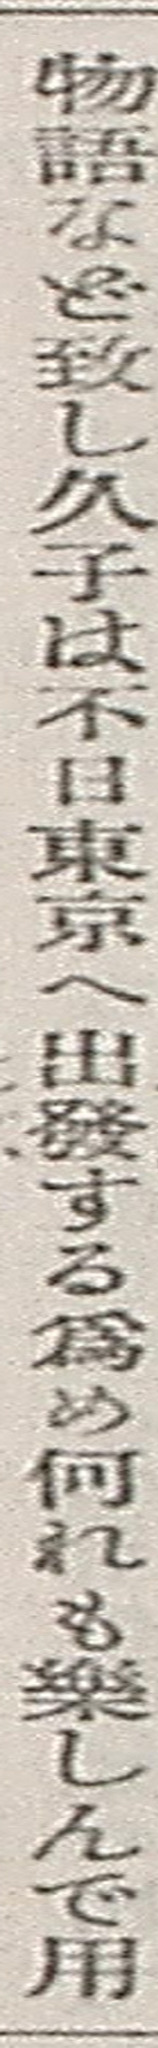物語など致し久子は不日東京へ出発する為め何れも楽しんで用
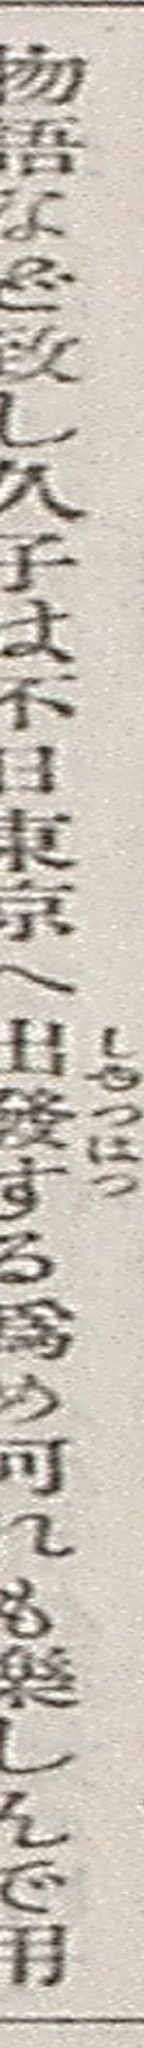物語など致し久子は不日東京へ出発する為め何れも楽しんで用
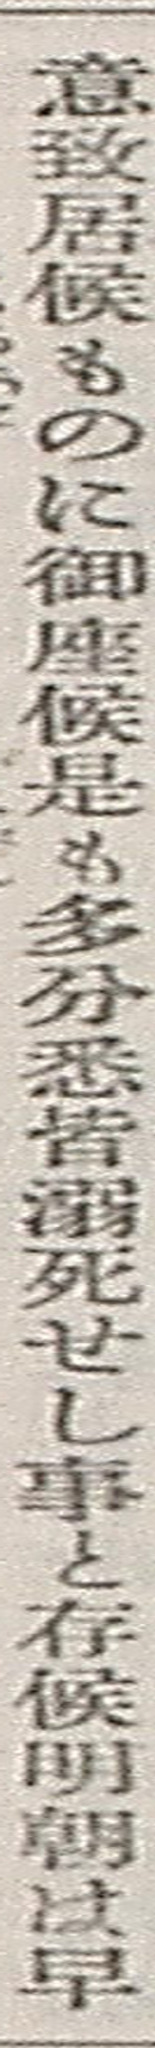意致居候ものに御座候是も多分悉皆溺死せし事と存候明朝は早
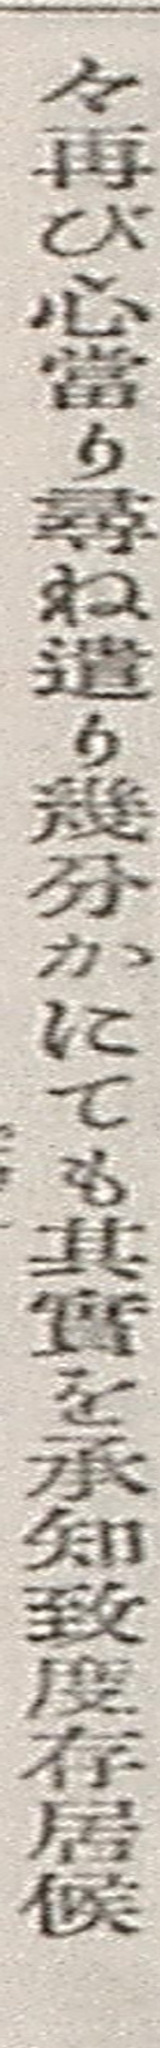々再び心当り尋ね遣り幾分かにても其実を承知致度存居候
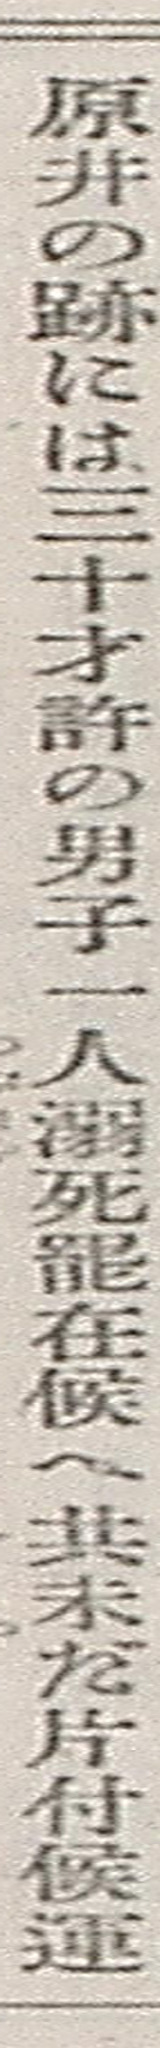原井の跡には三十才許の男子一人溺死罷在候へ共未だ片付候運
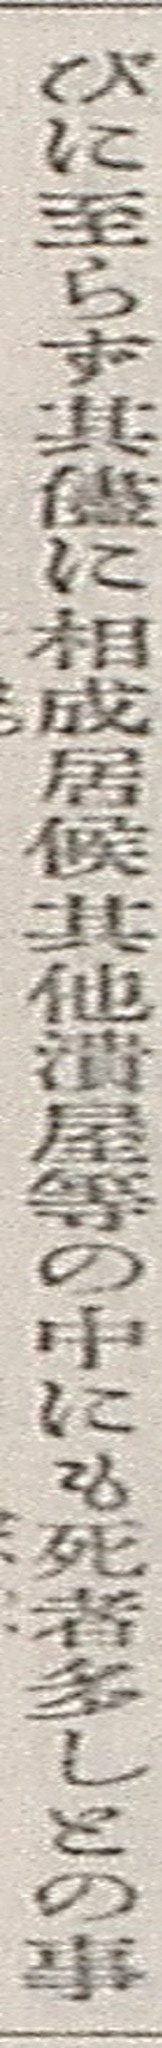びに至らず其の儘に相成居候其他潰屋等の中にも死者多しとの事
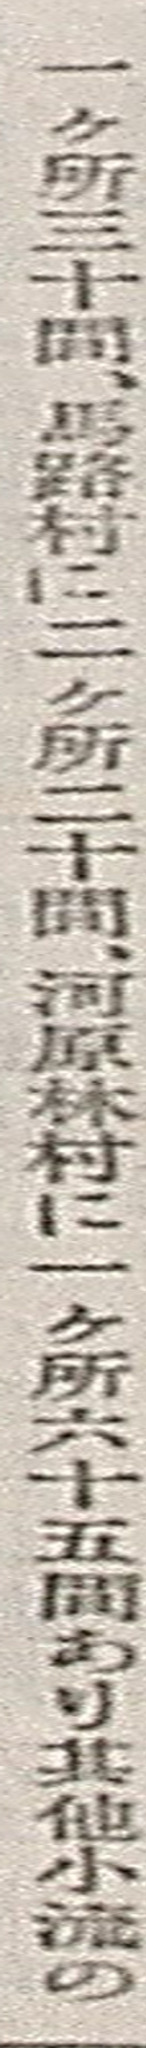一ヶ所三十間、馬路村に二ヶ所二十間、河原林村に一ヶ所六十五間あり其他小流の
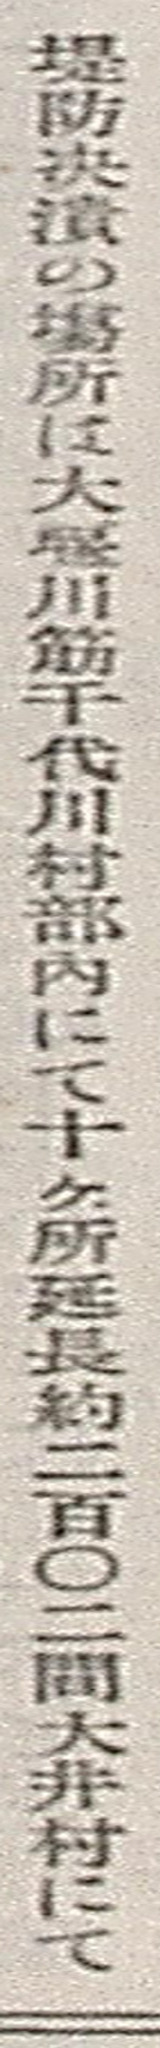堤防决潰の場所は大堰川筋千代川村部内にて十ヶ所延長約二百０二間大井村にて
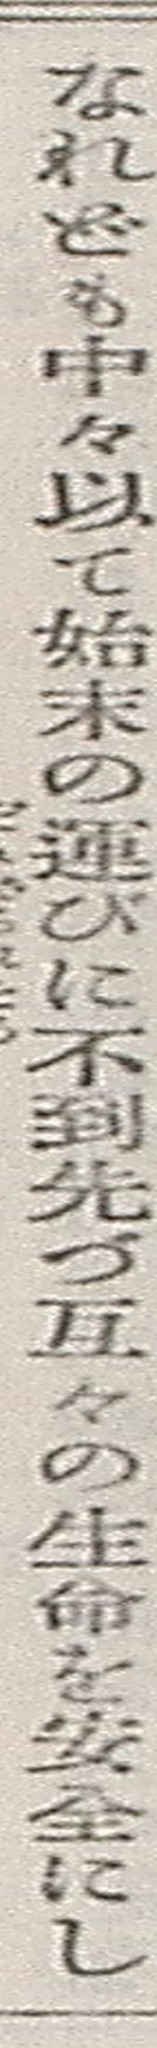なれども中々以て始末の運びに不到先づ互々の生命を安全にし
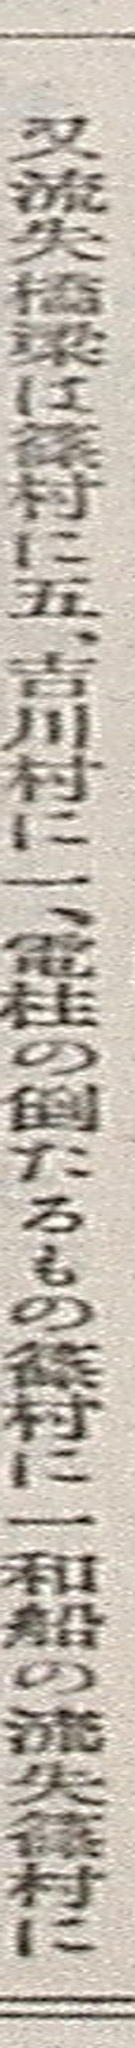又流失橋梁は篠村に五、吉川村に一、電柱の倒たるもの篠村に一和船の流失篠村に
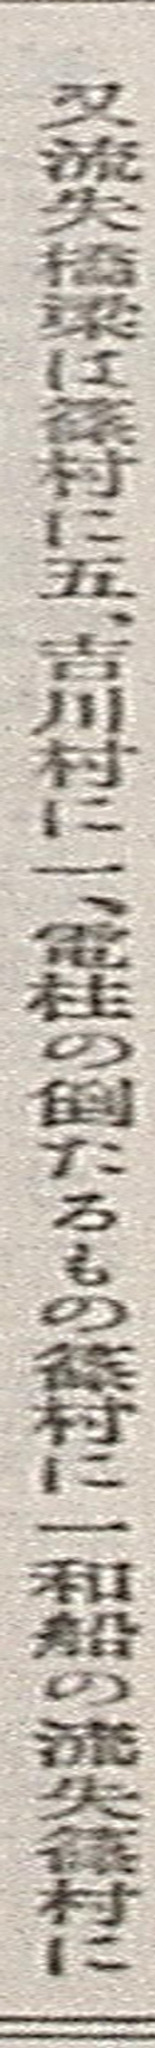又流失橋梁は篠村に五、吉川村に一、電柱の倒たるもの篠村に一和船の流失篠村に
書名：風俗畫報臨時増刊第百二十六號　洪水被害録（中）
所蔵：東京大学地震研究所図書室 Earthquake Research Institute Library, The University of Tokyo, JAPAN
